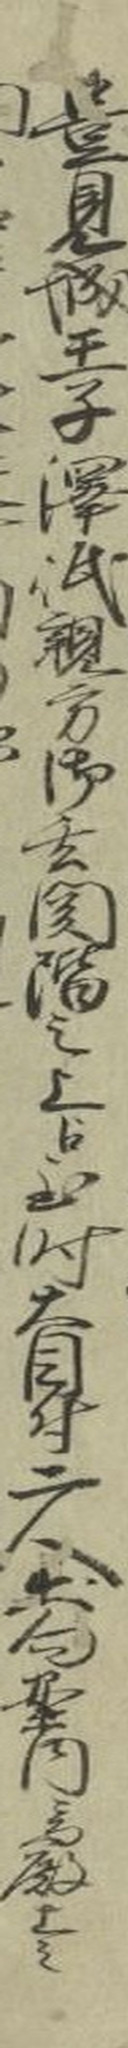一豊見城王子沢岻親方御玄関階之上え至時大目付二人出向案内にて殿上之
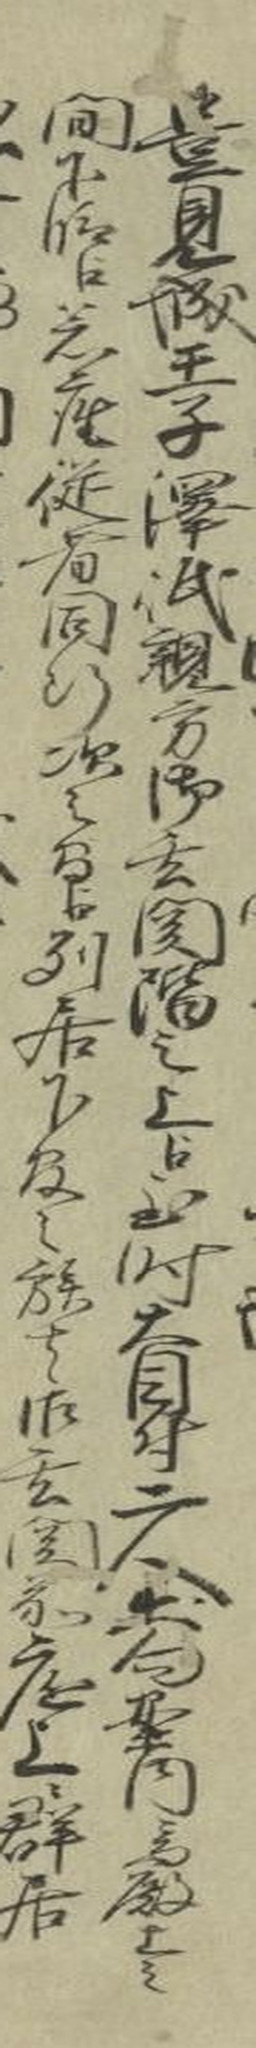間下段え着座従者同断次之間え列居下官之族は御玄関前庭上群居
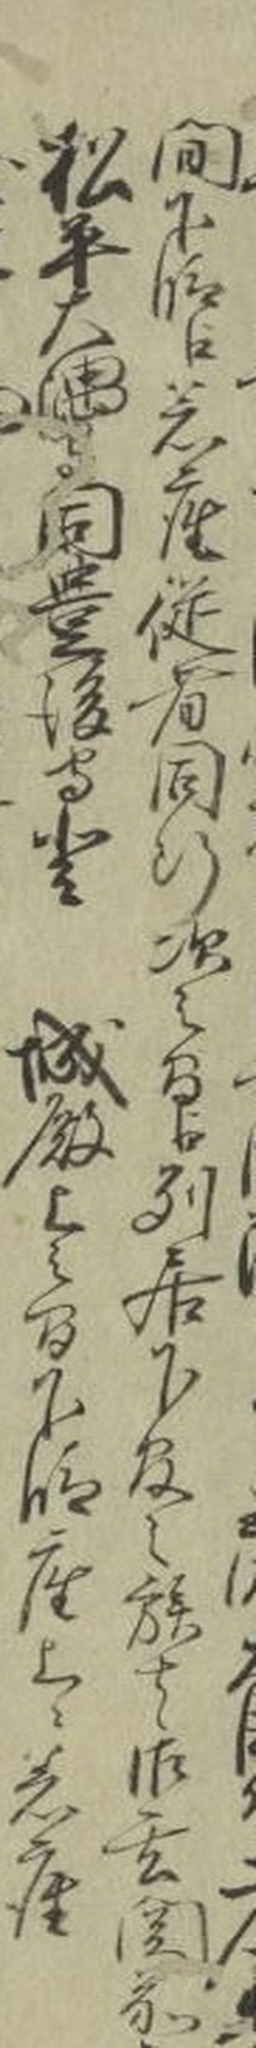一松平大隅守同豊後守登城殿上之間下段座上に着座
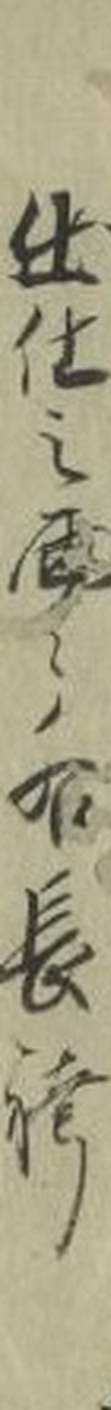一出仕之面々各長袴
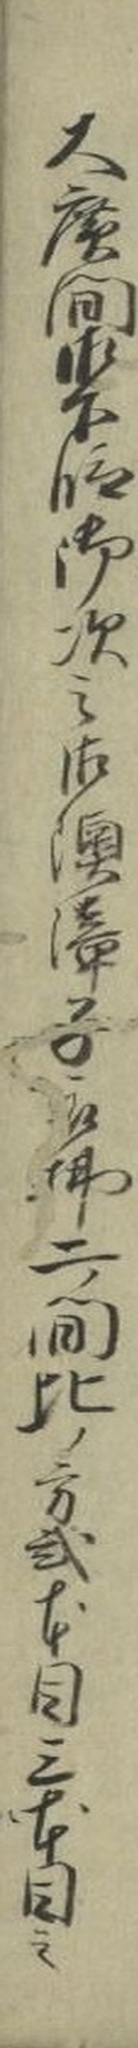一大広間御下段御次之御襖障子取払二の間北の方弐本目三本目之

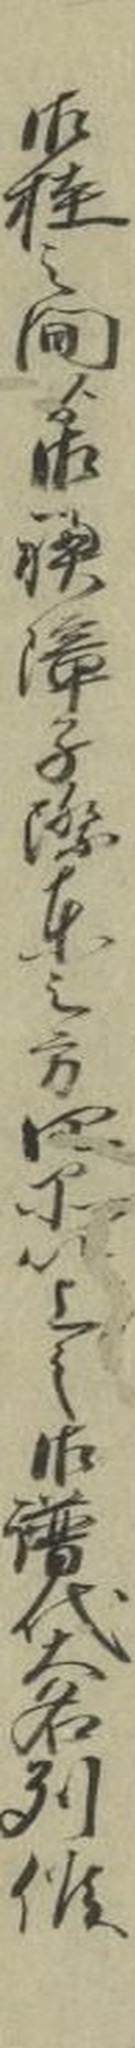御桂之間ゟ御襖障子際東之方四品以上之御譜代大名列候
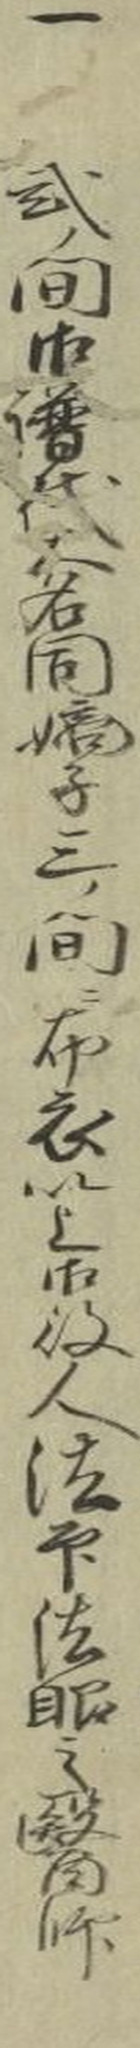一弐の間御譜代大名同嫡子三の間に布衣以上御役人法印法眼之医師
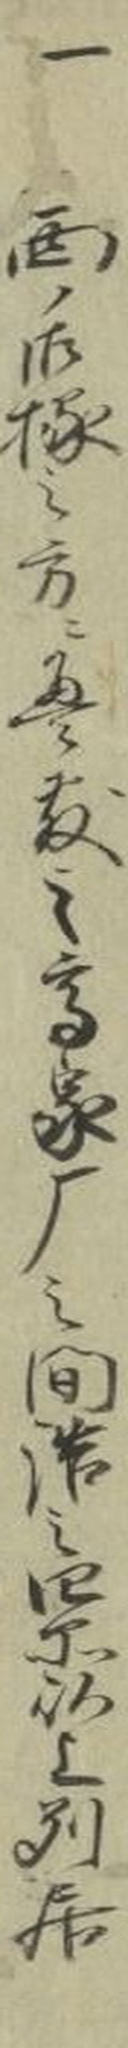一西の御縁之方に畳敷之高家鴈之間詰之四品以上列居
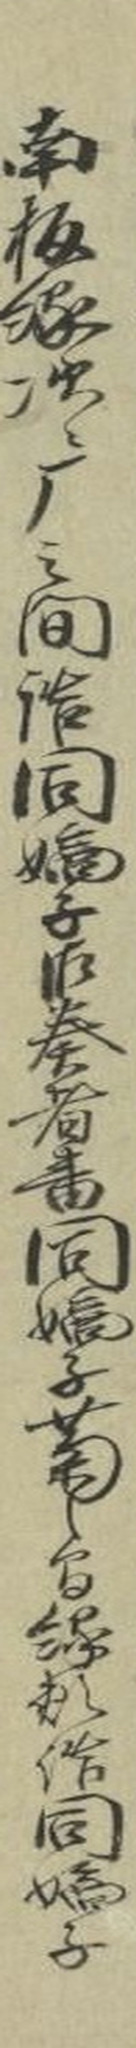一南板縁次の雁の間詰同嫡子御奏者番同嫡子菊之間縁頬詰同嫡子
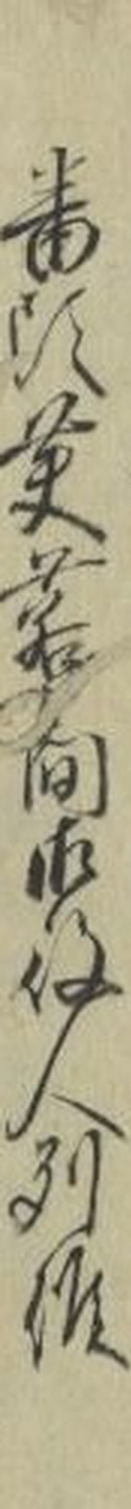番頭芙蓉間御役人列候
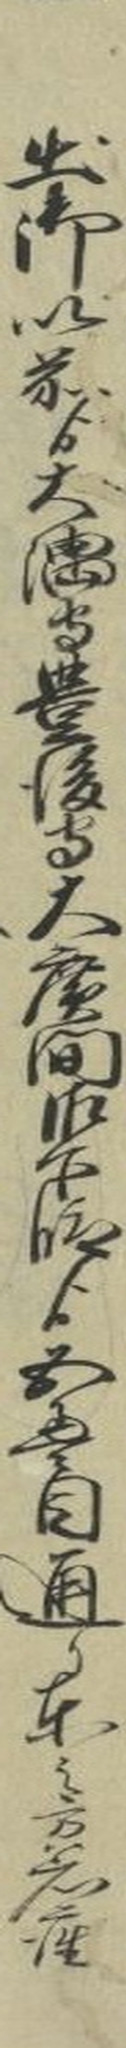一出御以前ゟ大隅守豊後守大広間御下段ゟ五畳目通り東之方着座
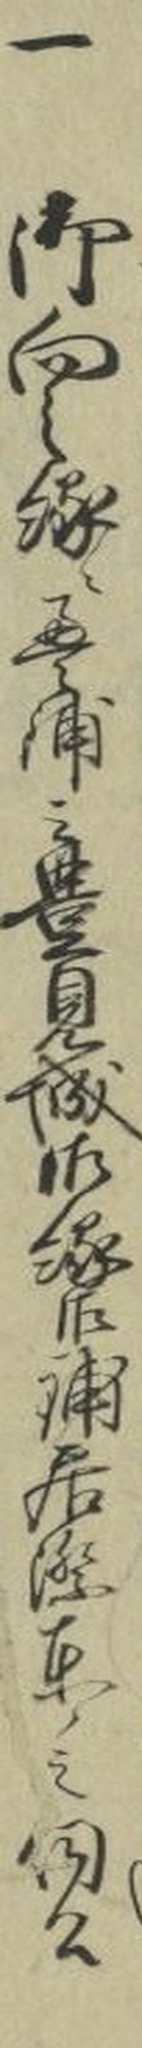一御向之縁に畳鋪之豊見城御縁御鋪居際東の之伺公
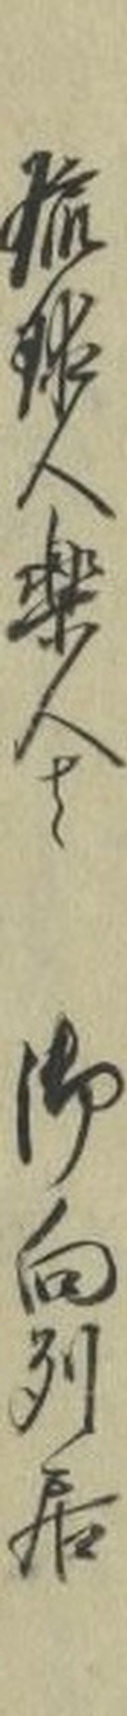琉球人楽人は御向列居
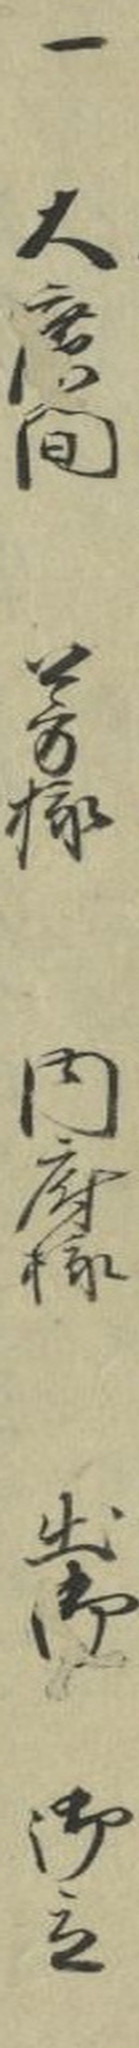一大広間公方様内府様出御御立
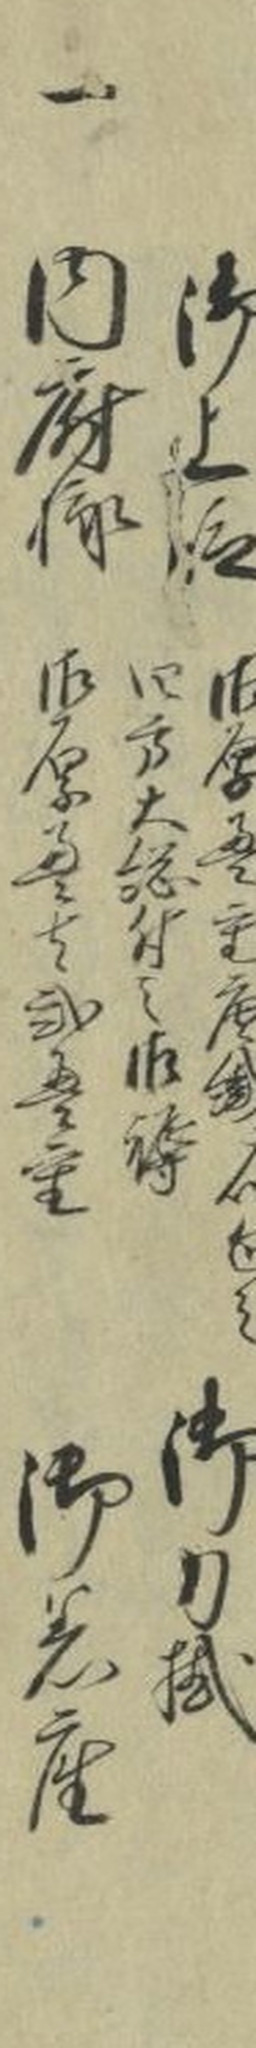一内府様御厚畳は弐畳重御着座
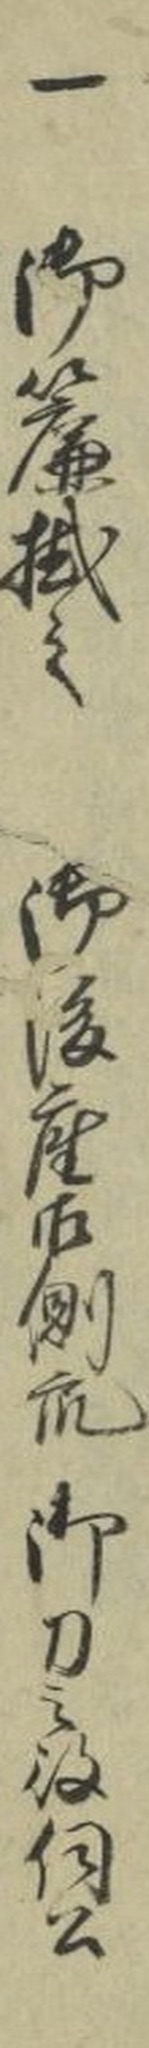一御簾掛之御後座御側衆御刀之役伺公
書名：天保三壬辰年琉球人参府之節勤方書留
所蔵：University of the Ryukyus Library
